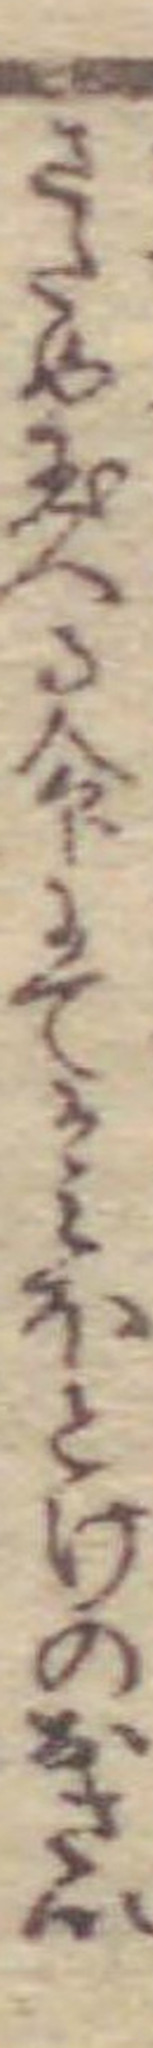さため玉へる今命にてかみほとけのおさい
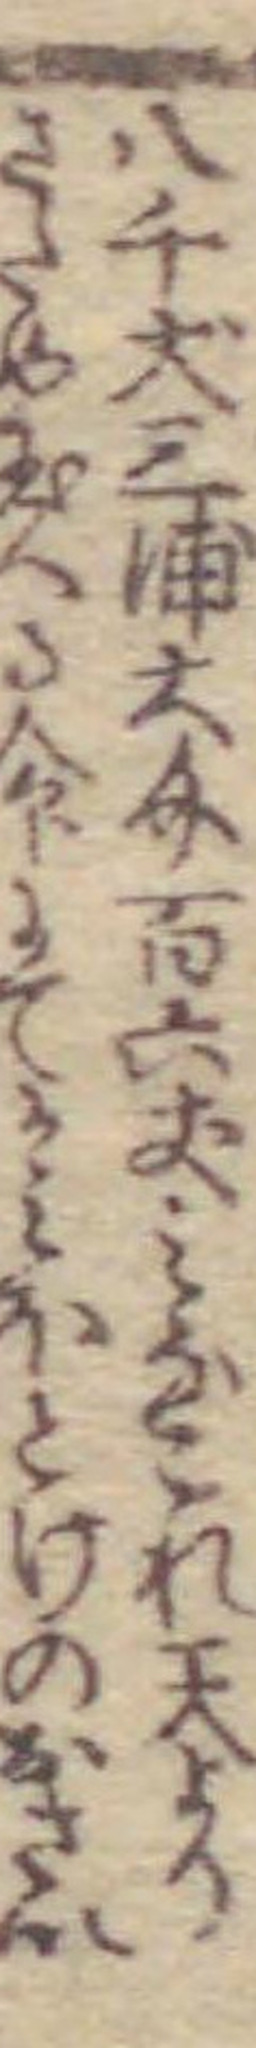さため玉へる今命にてかみほとけのおさい
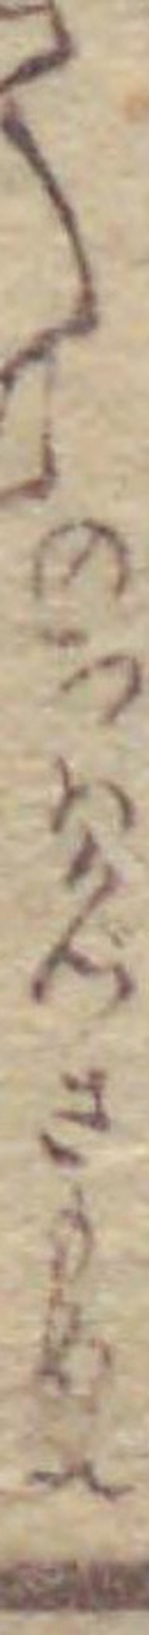のちはかづさもめん
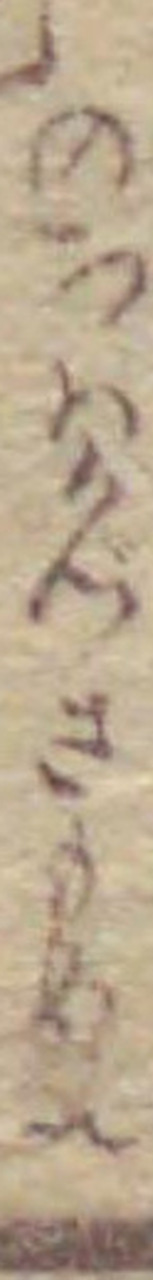のちはかづさもめん
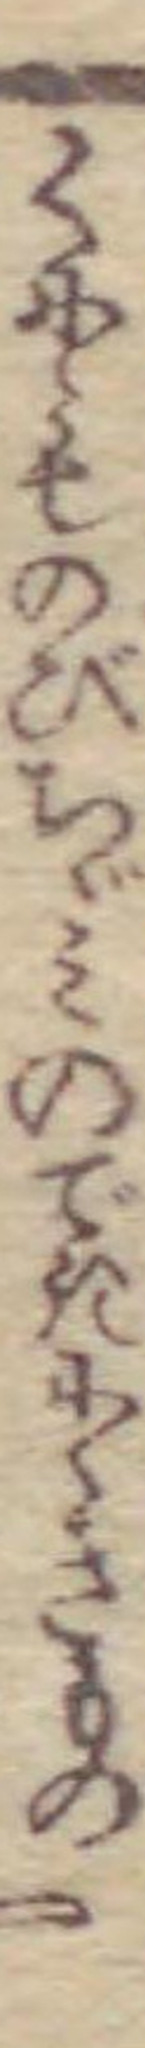かくにとものびちゞみのできにくきもの
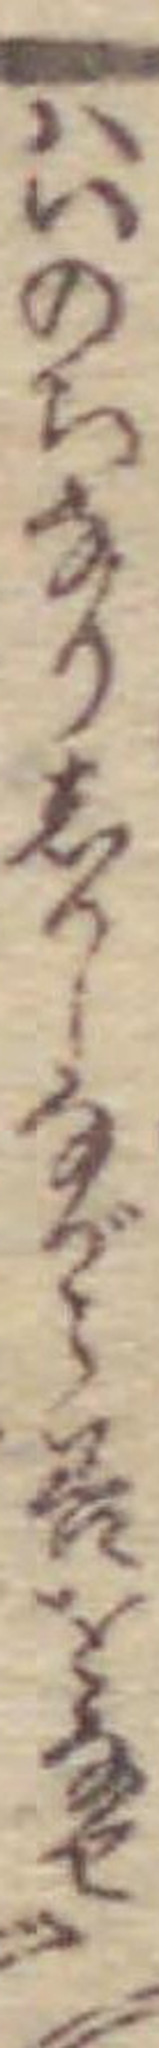はいのちなりしかしながら善をなせ
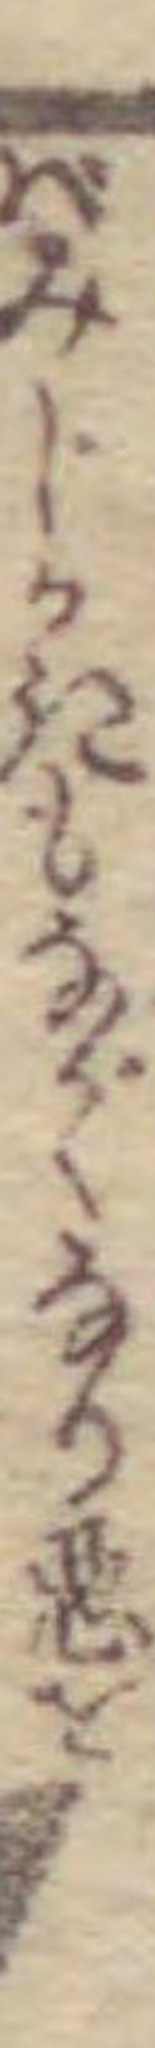ばみじかきもながくなり悪を
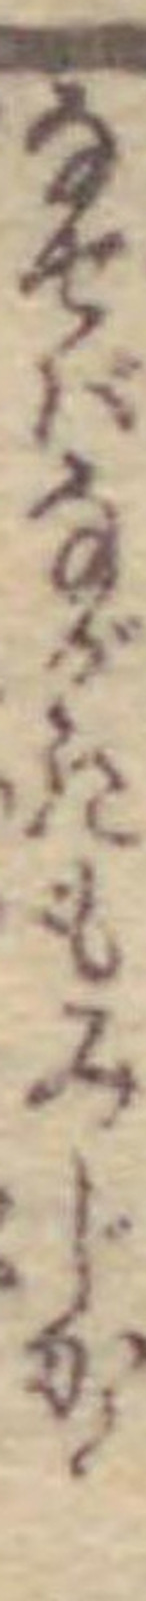なせばながきもみじかく
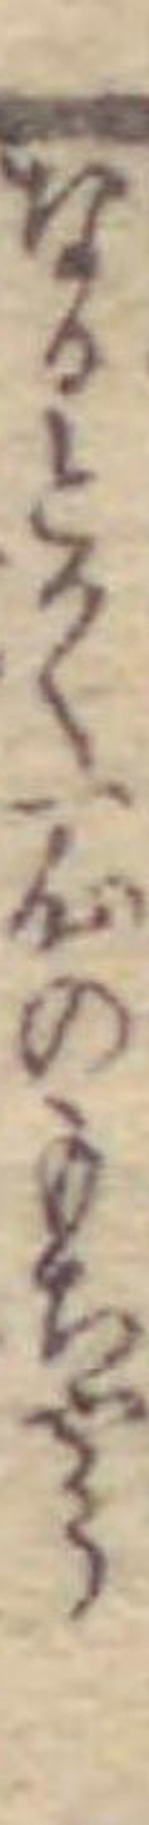なるとかく一心のもちやう
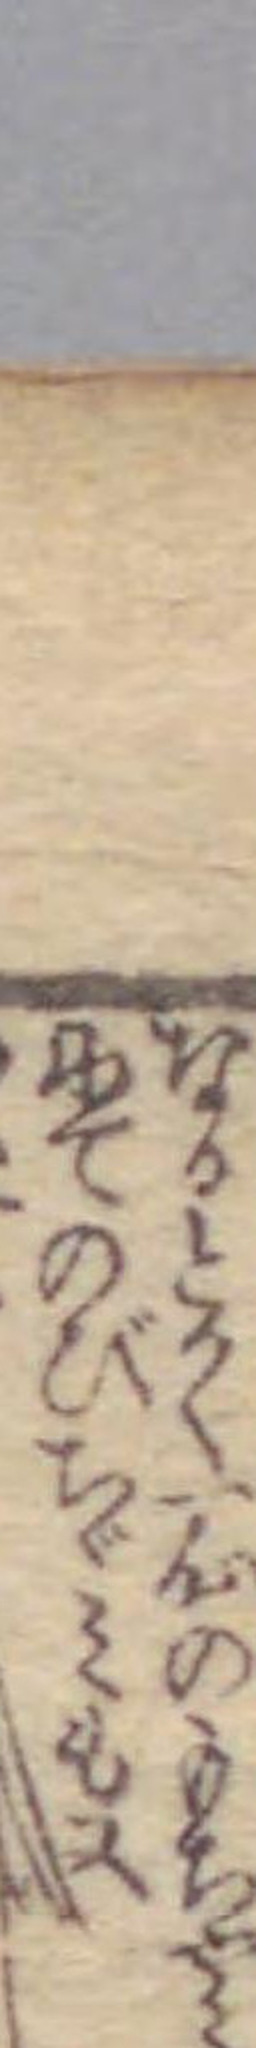にてのびちゞみも又
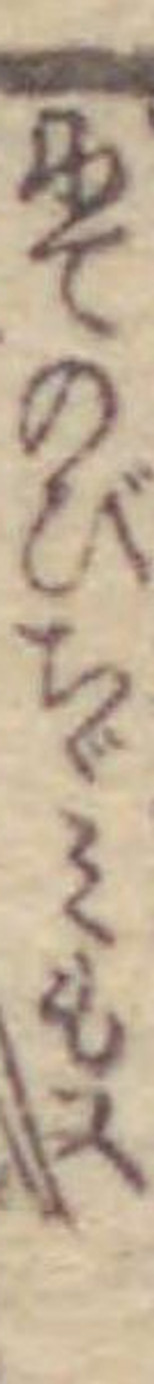にてのびちゞみも又
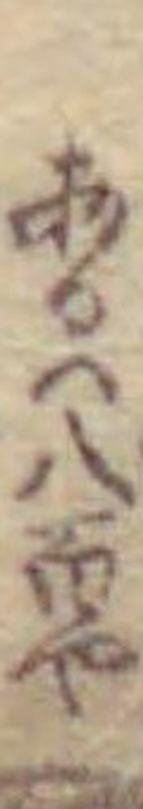あるは八百や
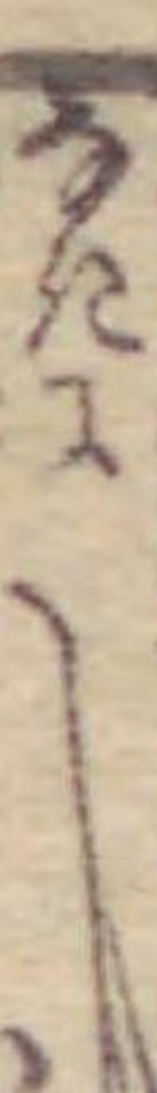なきに
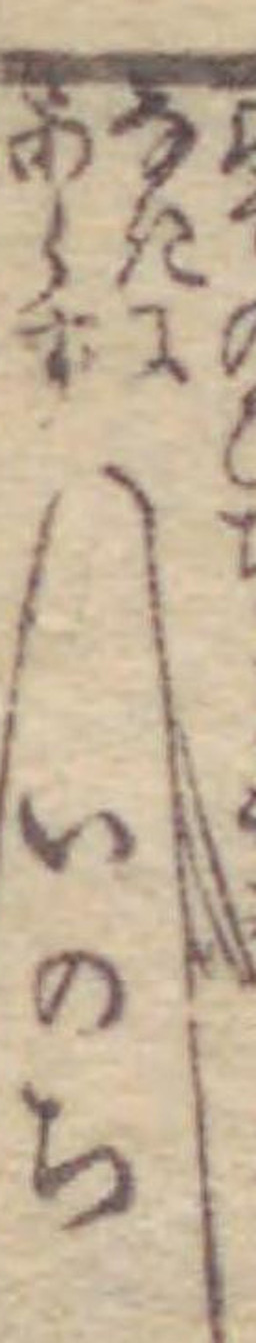あらず
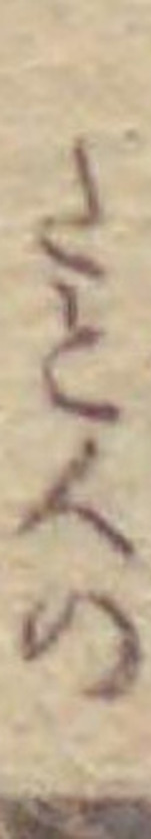たと人の
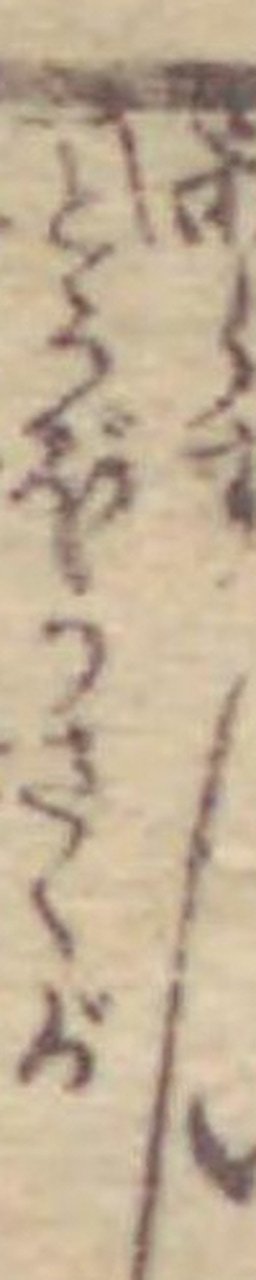〽とうぼうさくが
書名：御誂染長寿小紋 : 3巻
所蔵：国立国会図書館 National Diet Library, JAPAN
